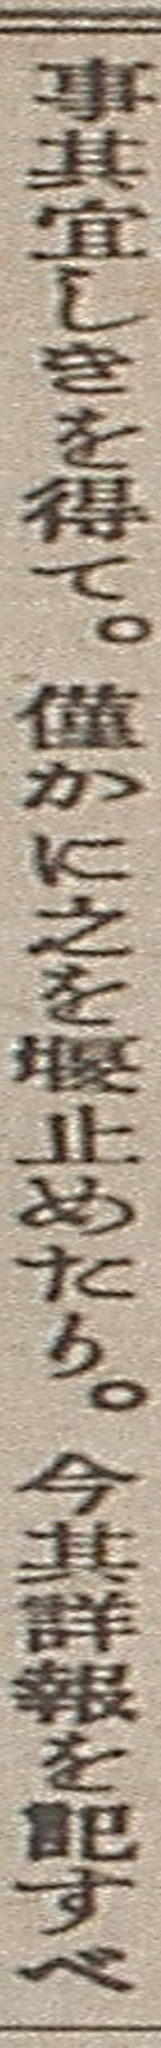事其宜しきを得て。僅かに之を堰止めたり。今其詳報を記すべ
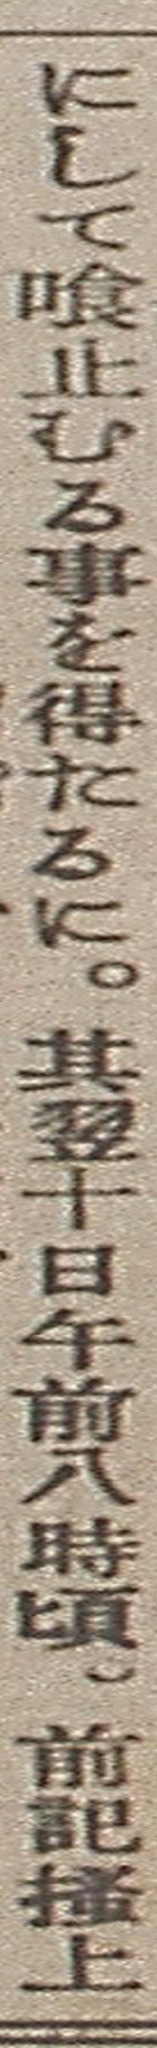にして喰止むる事を得たるに。其翌十日午前八時頃。前記掻上
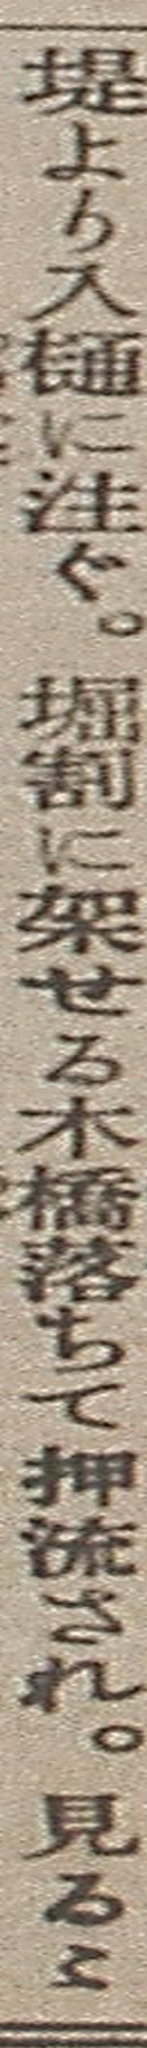堤より入樋に注ぐ。掘割に架せる木橋落ちて押流され。見る〻
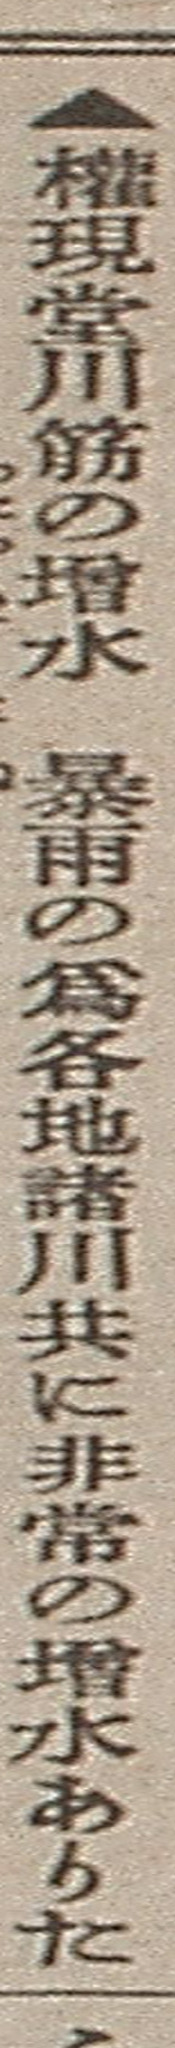▲権現堂川筋の増水暴雨の為各地諸川共に非常の増水ありた
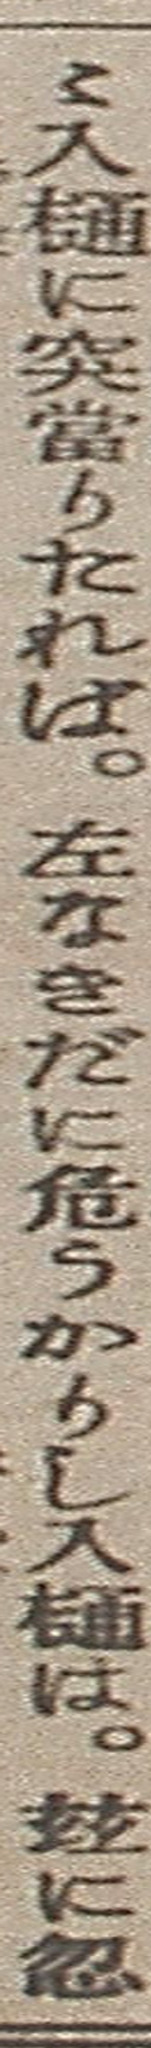〻入樋に突当りたれば。左なきだに危うかりし入樋は。茲に忽
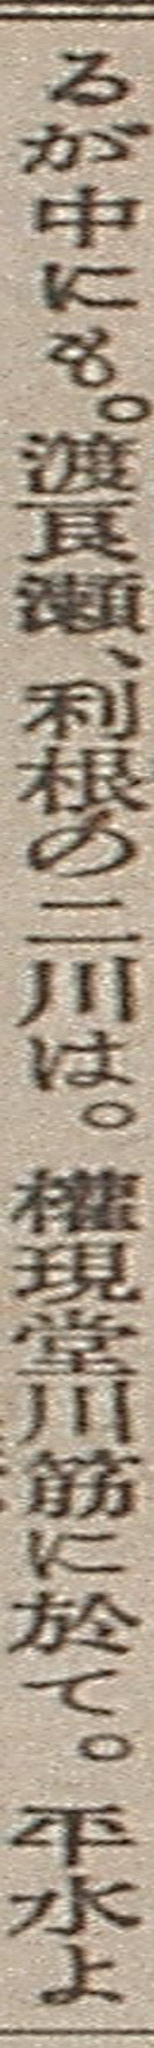るが中にも。渡良瀬、利根の二川は。権現堂川筋に於て。平水よ
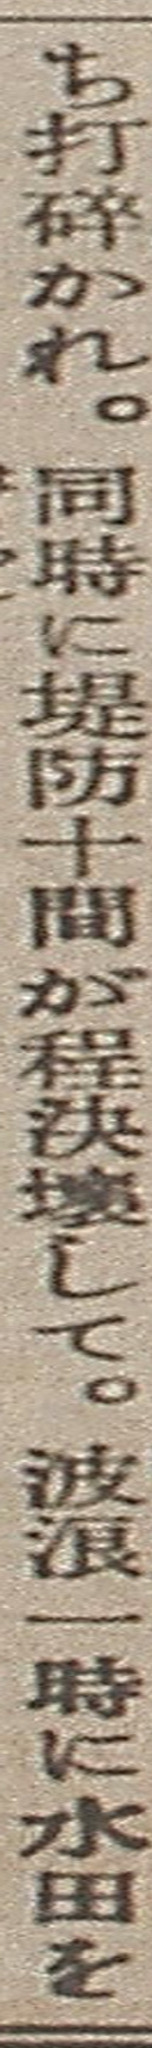ち打砕かれ。同時に堤防十間が程決壊して。波浪一時に水田を
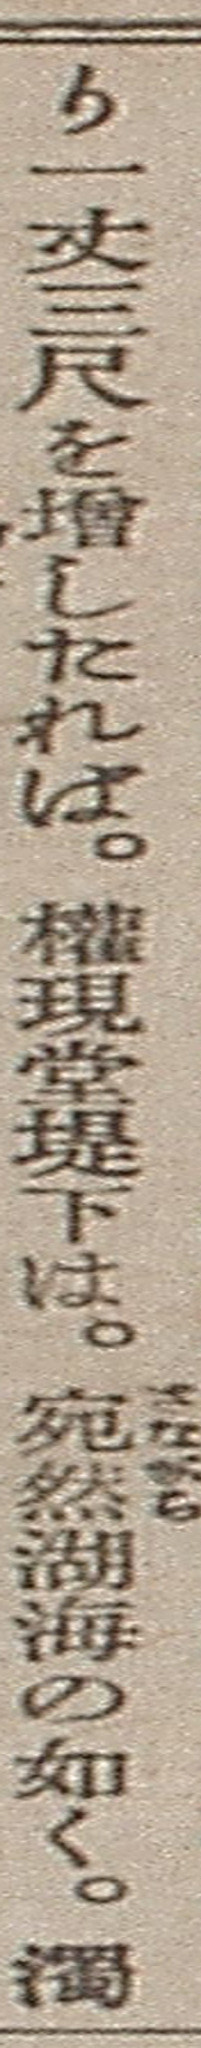り一丈三尺を増したれば。権現堂堤下は。宛然湖海の如く。濁
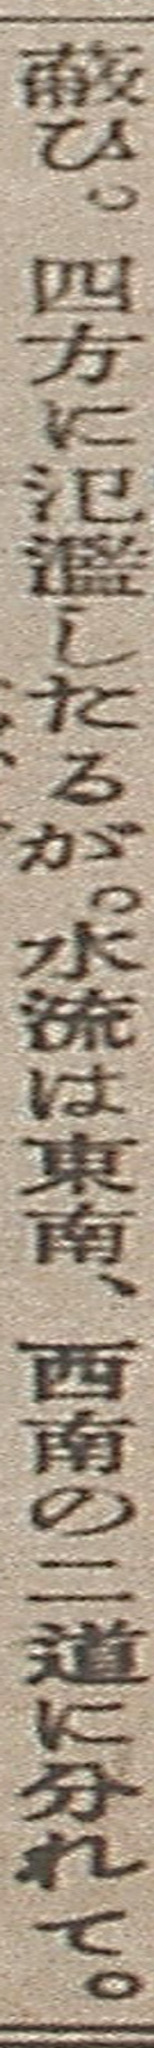蔽ひ。四方に氾濫したるが。水流は東南、西南の二道に分れて。
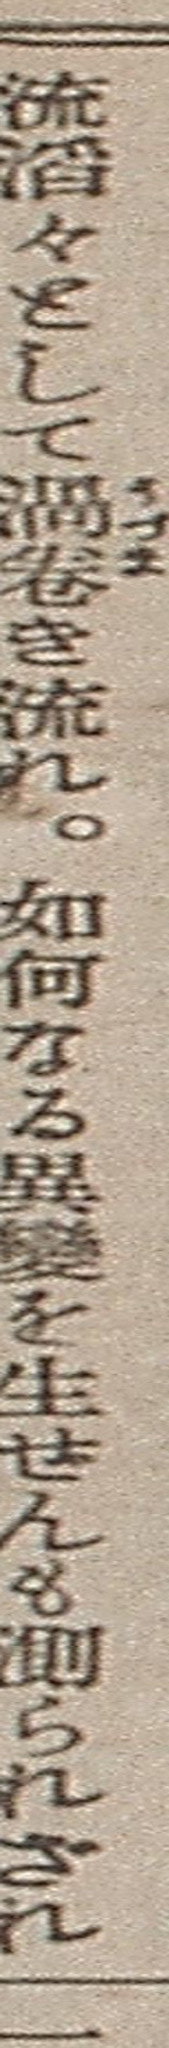流滔々として渦巻き流れ。如何なる異変を生せんも測られざれ
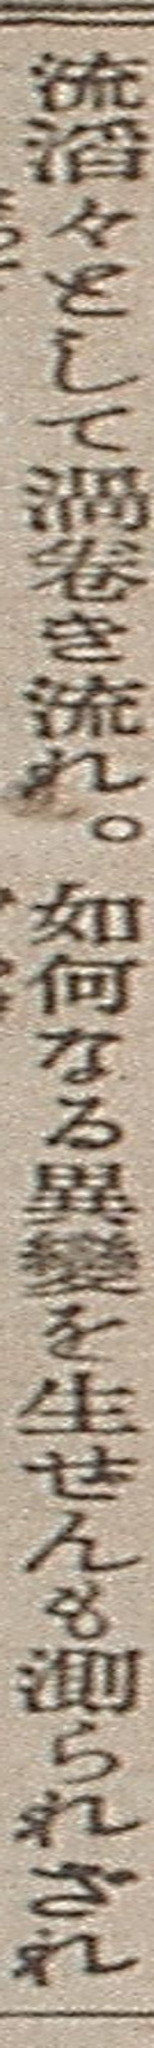流滔々として渦巻き流れ。如何なる異変を生せんも測られざれ
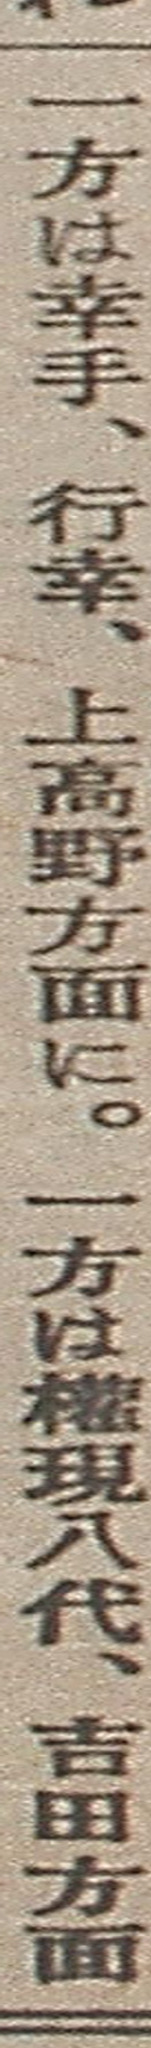一方は幸手、行幸、上高野方面に。一方は権現八代、吉田方面
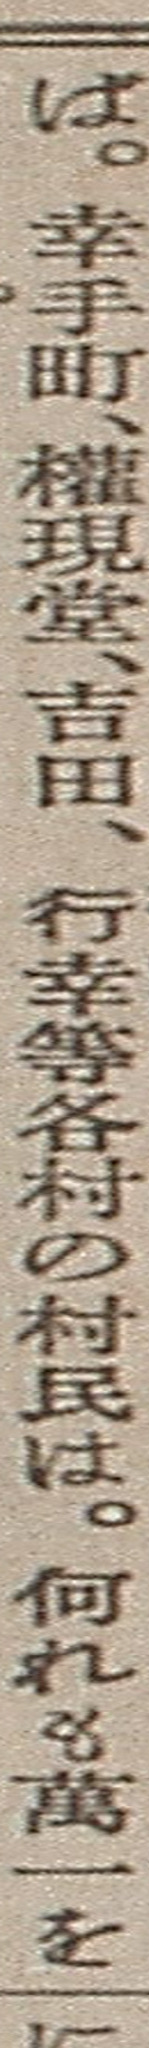ば。幸手町、権現堂、吉田、行幸等各村の村民は。何れも万一を
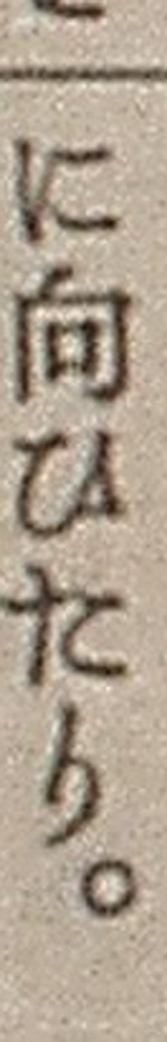に向ひたり。
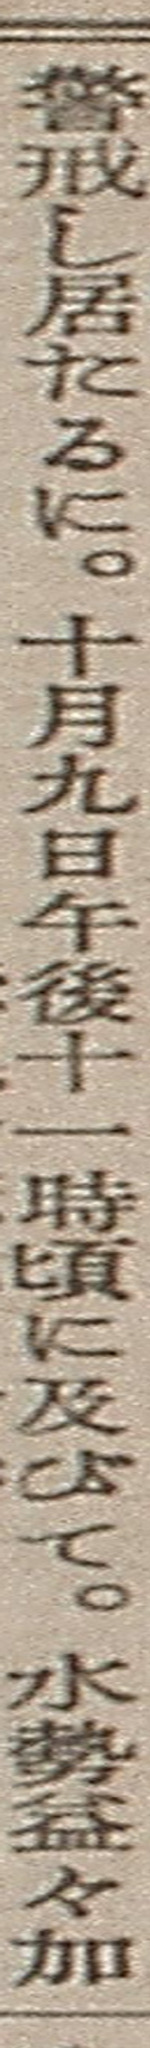警戒し居たるに。十月九日午後十一時頃に及びて。水勢益々加
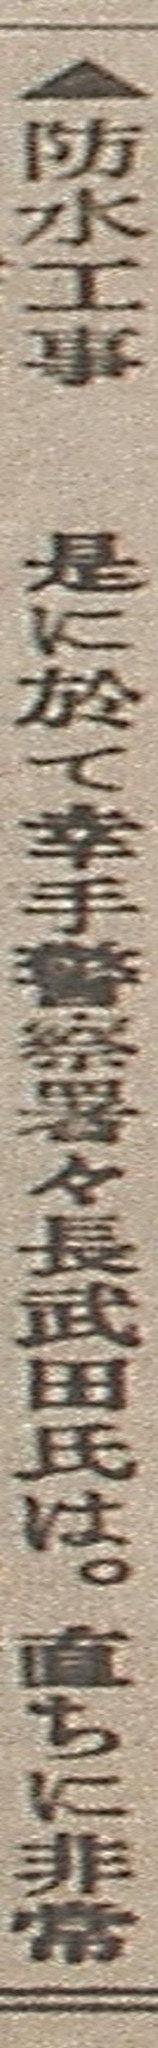▲防水工事是に於て幸手警察署々長武田氏は。直ちに非常
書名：風俗畫報臨時増刊第百九十九號　明治三十二年十月各地災害圖會（前編之續）
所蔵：東京大学地震研究所図書室 Earthquake Research Institute Library, The University of Tokyo, JAPAN
